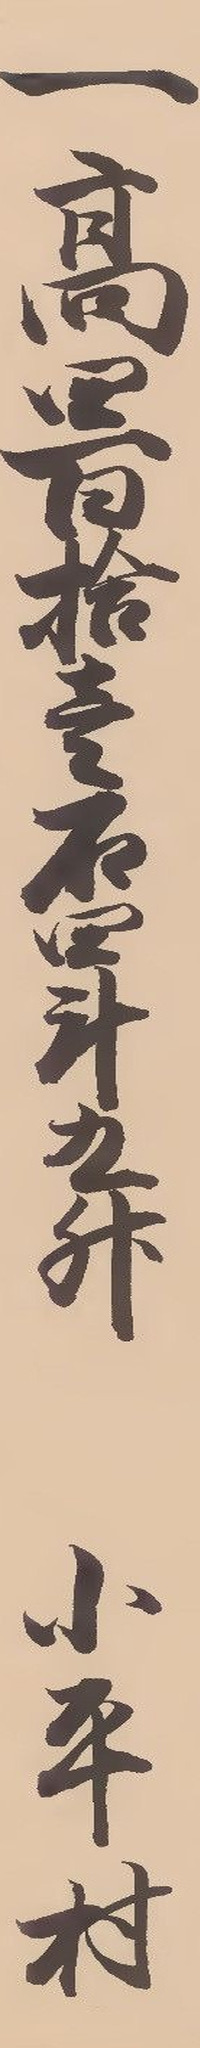一高四百拾壱石四斗九升小平村
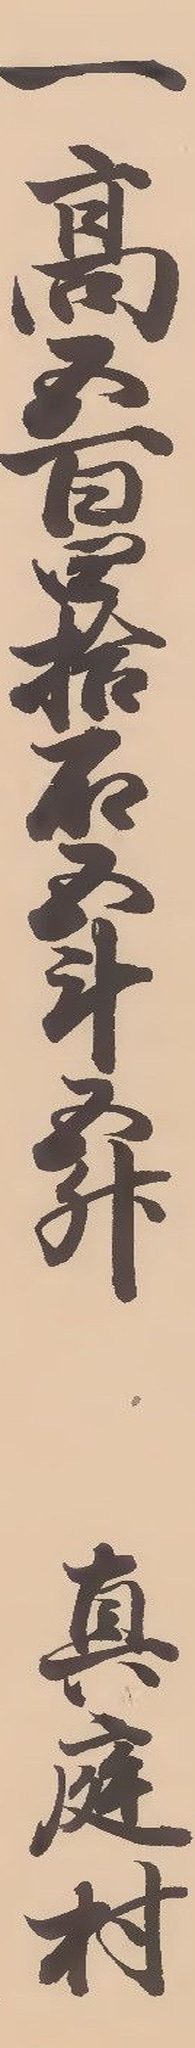一高五百四拾石五斗五升真庭村

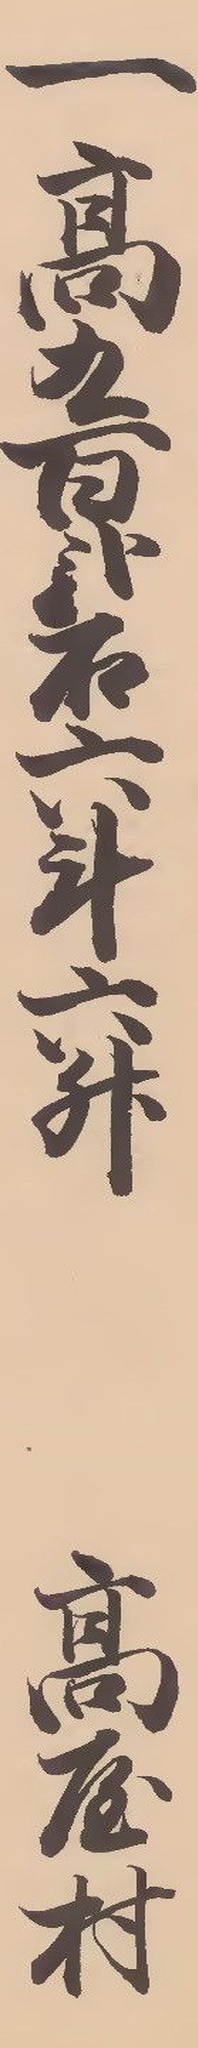一高九百弐石六斗六升高屋村
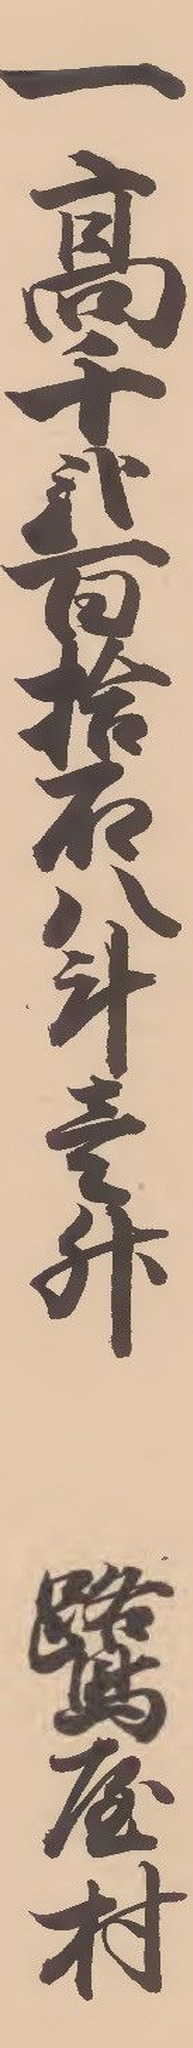一高千弐百拾石八斗壱升鷺屋村
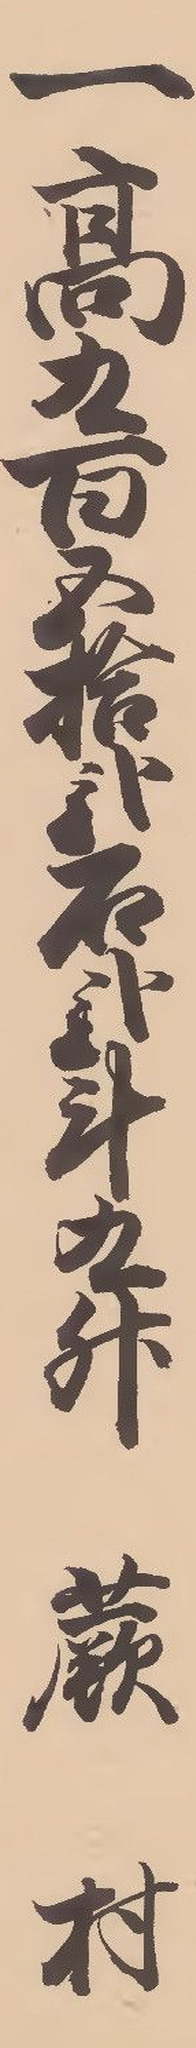一高九百五拾弐石弐斗九升蕨村
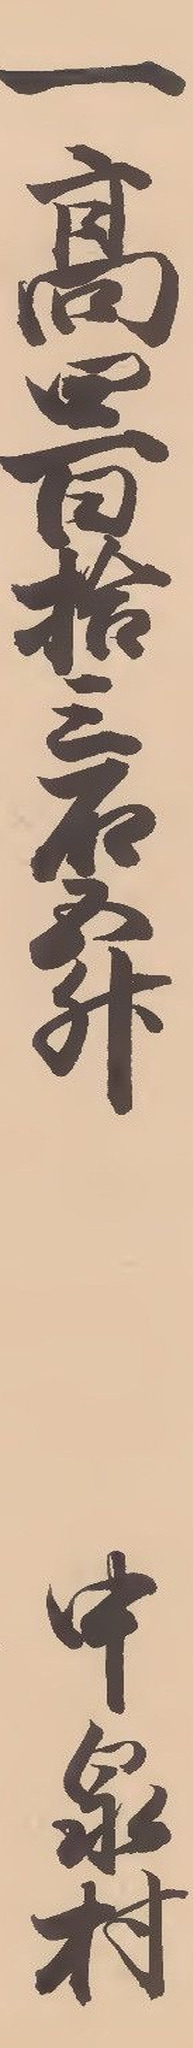一高四百拾三石五升中泉村
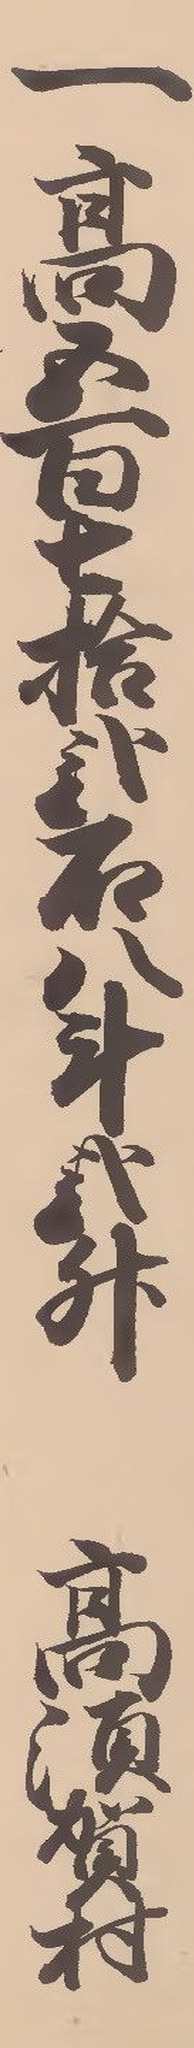一高五百七拾弐石八斗弐升高須賀村
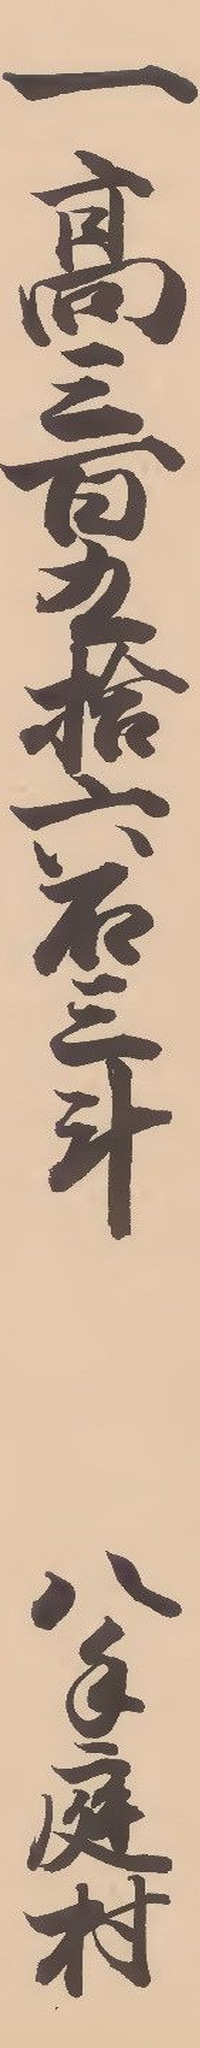一高三百九拾六石三斗八手庭村
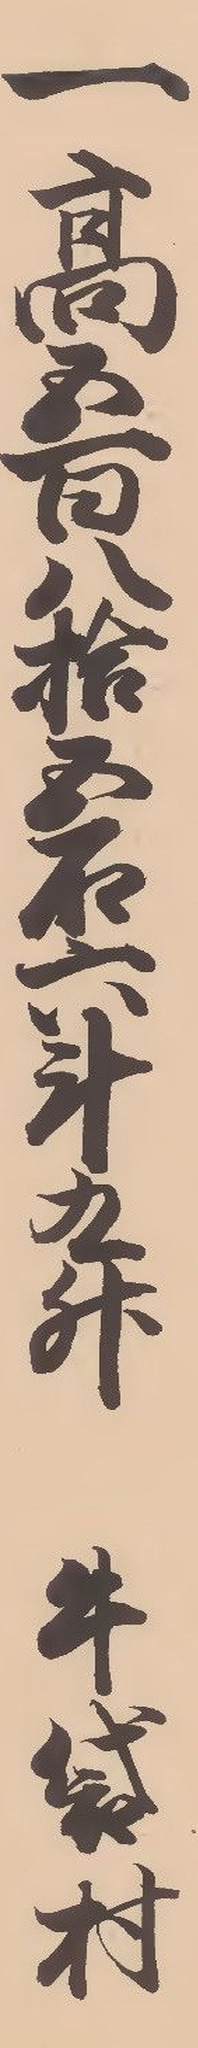一高五百八拾五石六斗九升牛袋村
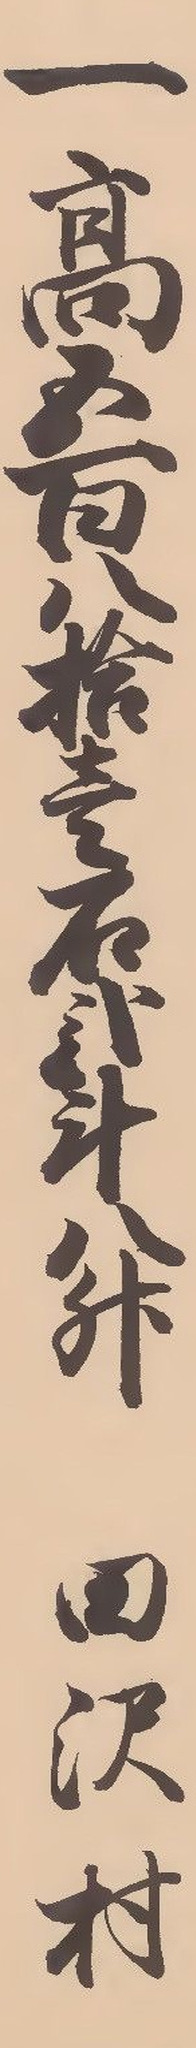一高五百八拾壱石弐斗八升田沢村

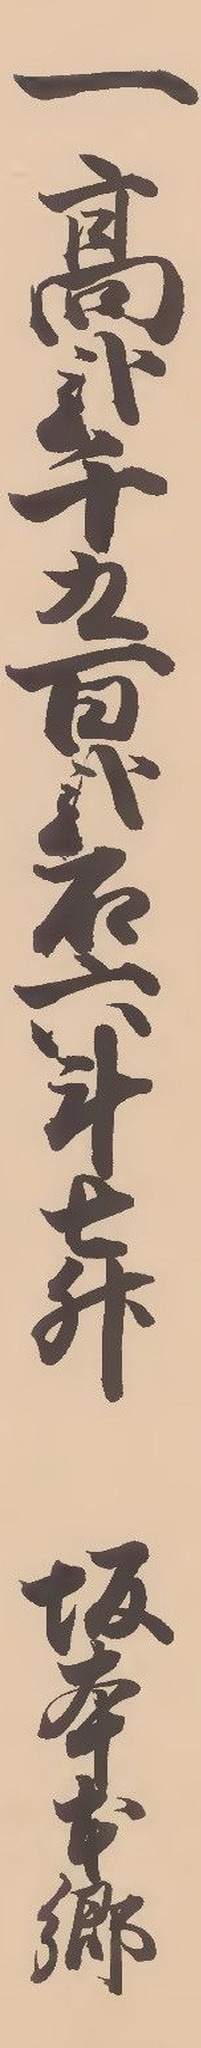一高弐千九百弐石六斗七升坂本本郷
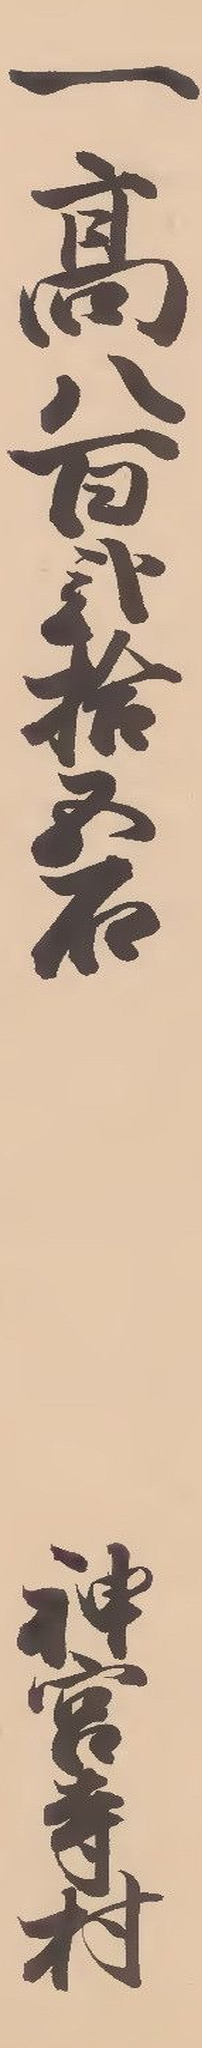一高八百弐拾五石神宮寺村
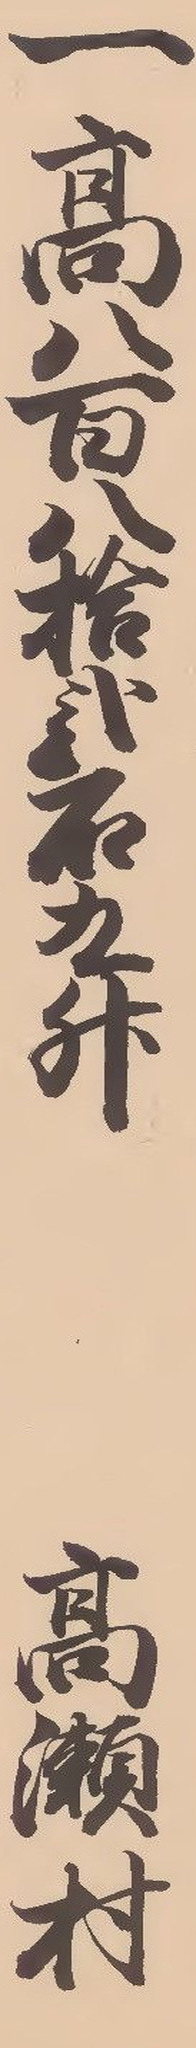一高八百八拾弐石九升高瀬村
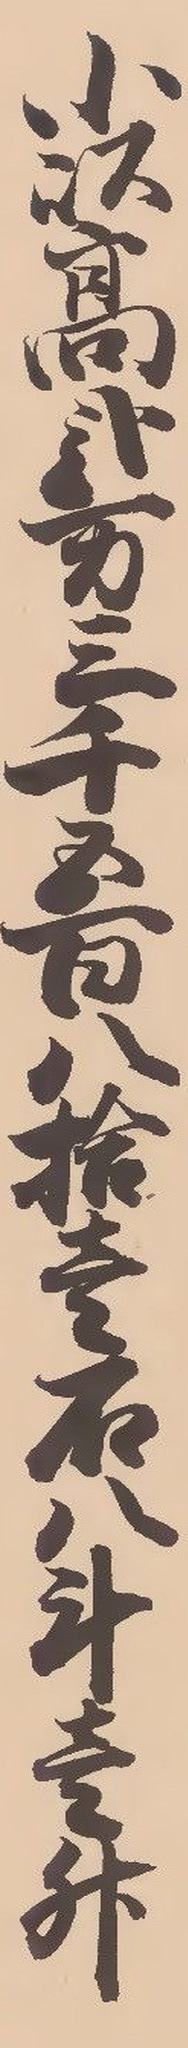小以高弐万三千五百八拾壱石八斗壱升

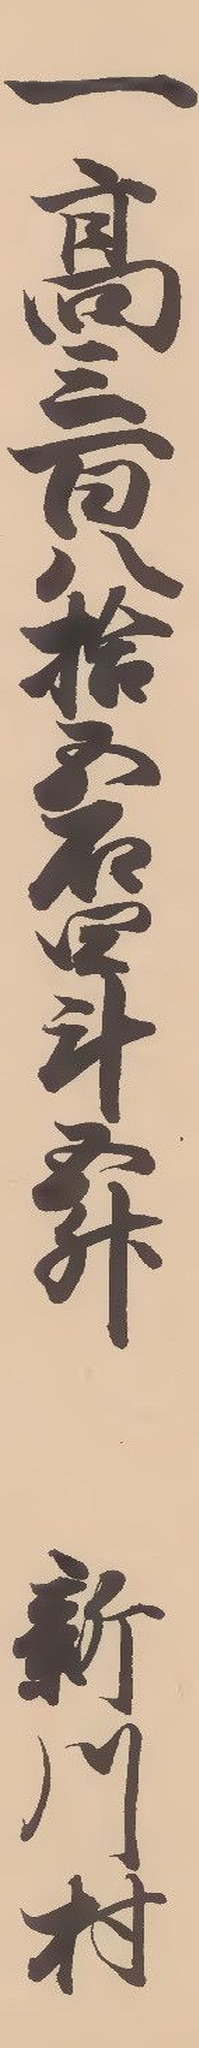一高三百八拾五石四斗五升新川村
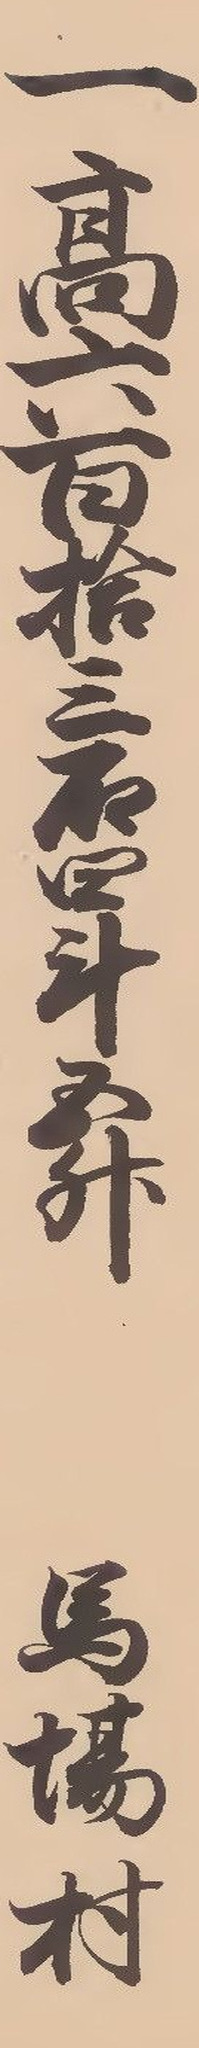一高六百拾三石四斗五升馬場村
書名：陸奥国郷帳　５
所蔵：国立公文書館 National Archives of Japan
